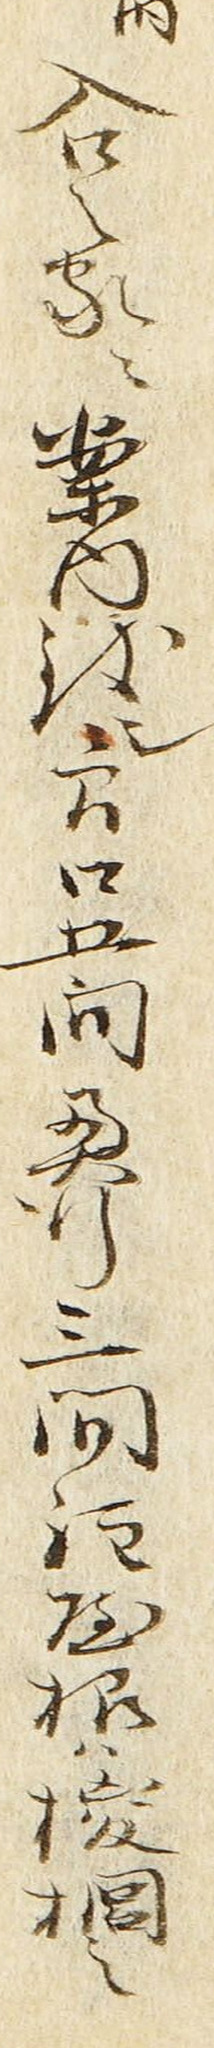入口之家に案内致し間口五間奥行三間程屋根は梭櫚之
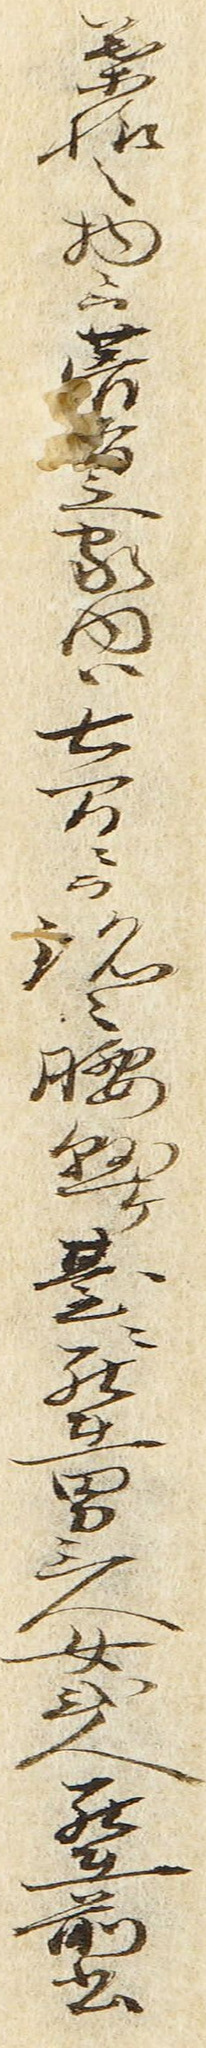葉様之物に而蓋有之家内は七間に而銘銘腰懸ケ台に罷在男三人女弐人罷在前出
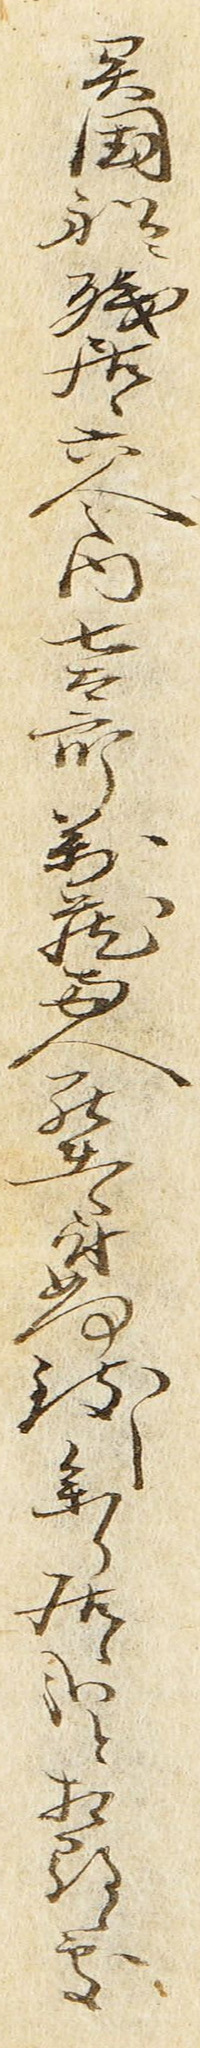異国船に残居候六人之内七太郎藤蔵両人罷在候に付如何致し参り居候哉と相尋候處
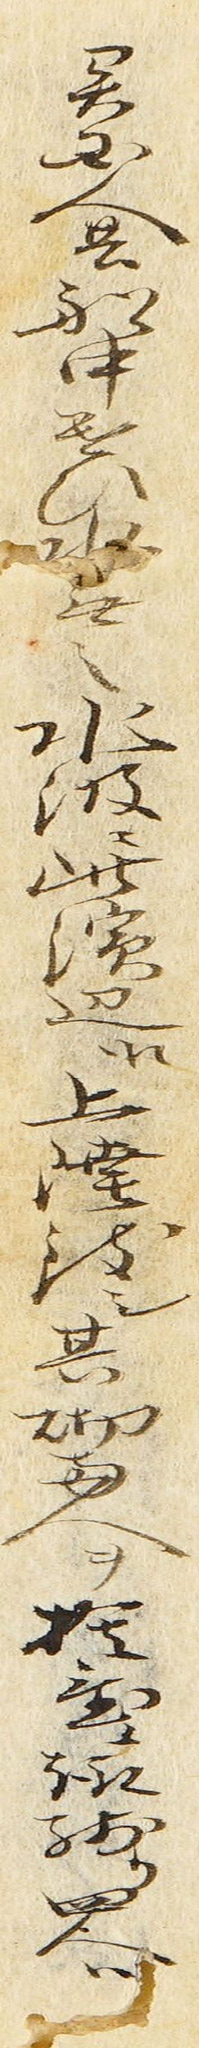異国人共船中遣ひ水無之水汲に此浜辺江上陸致し其砌両人ヲ捨置に趣残り四人は
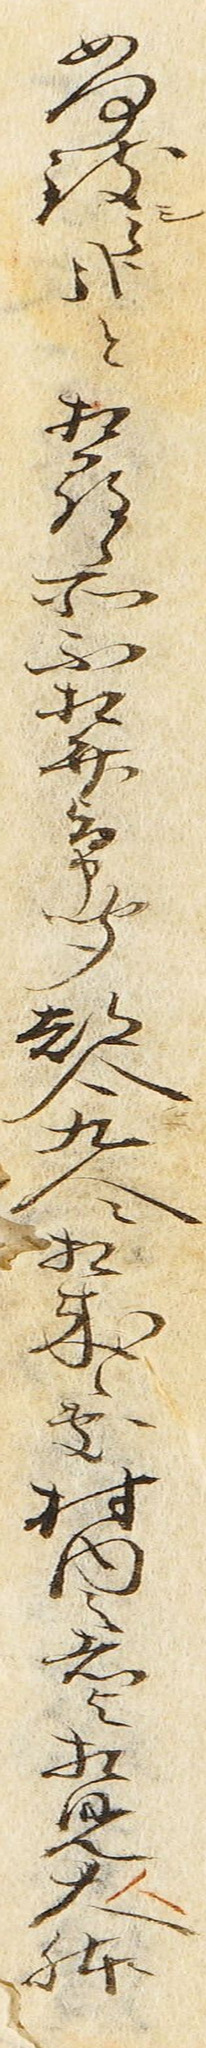如何致し候哉と相尋候所不相弁旨申聞都合九人に相来候處村内之者と相見人躰
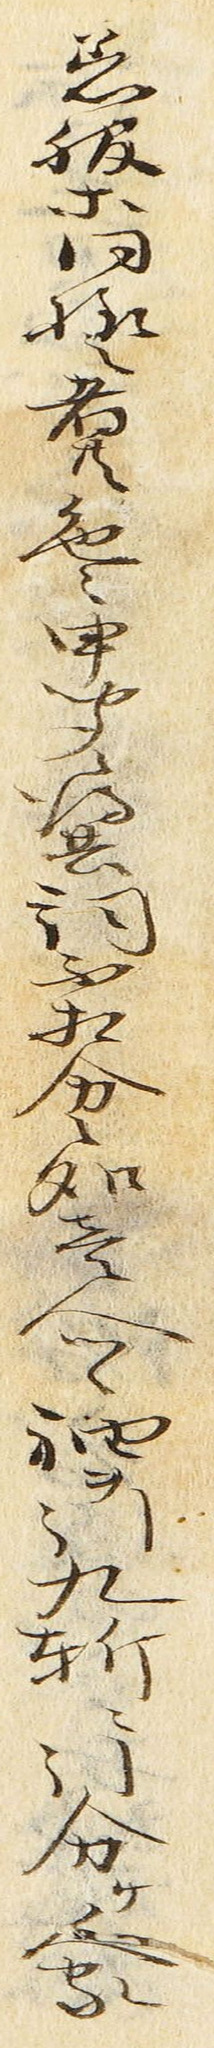着服等同様之者共色々申聞候得共詞不相分候処壱人ツツ袖ヲ引九斬に引分ケ人家
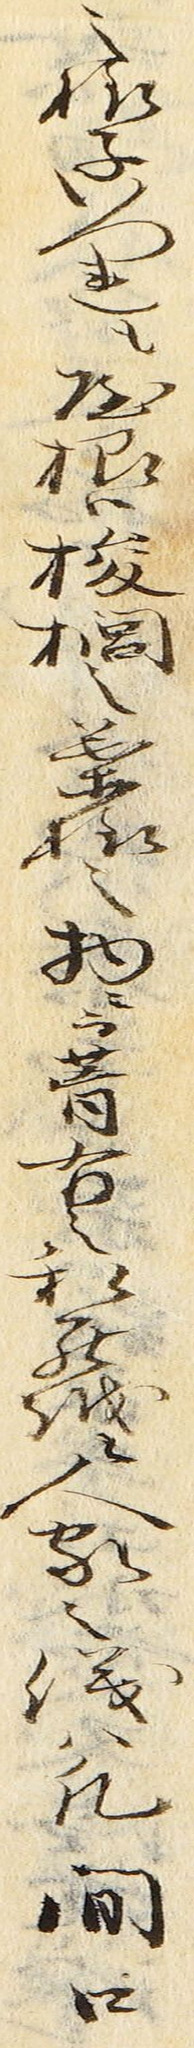之様子いつれも屋根は梭櫚之葉様之物に而蓋有之私罷越之人家之儀は凡間口
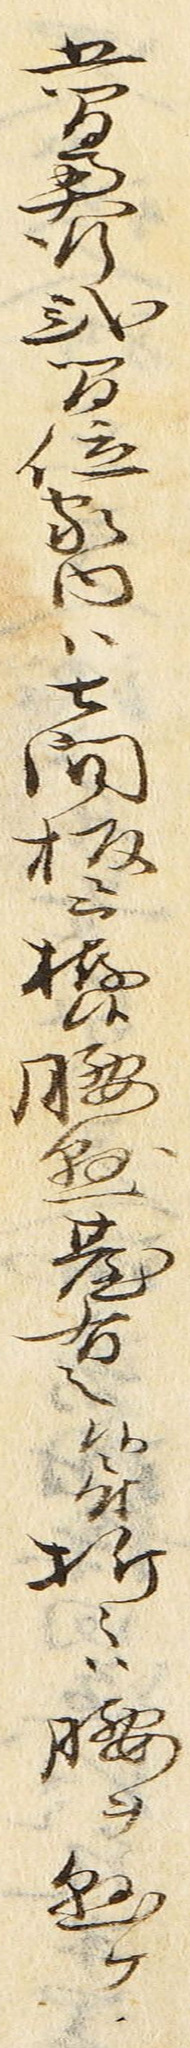五間奥行弐間位家内は七間板に而拵候腰懸台有之候に付折々は腰を懸ケ
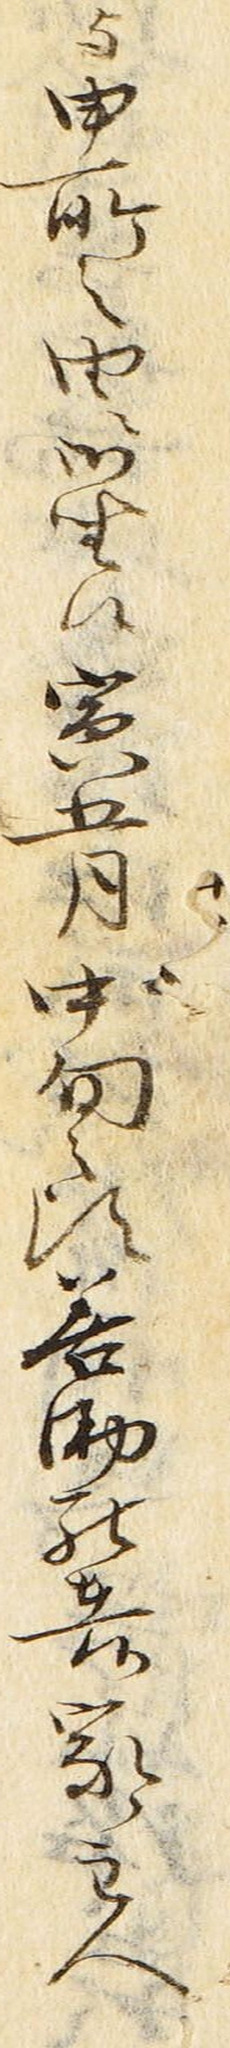と申所之由に御座候寅五月中旬之頃善助罷在候家之主人
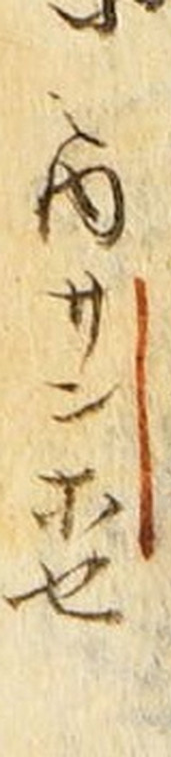之内サンㇹセ
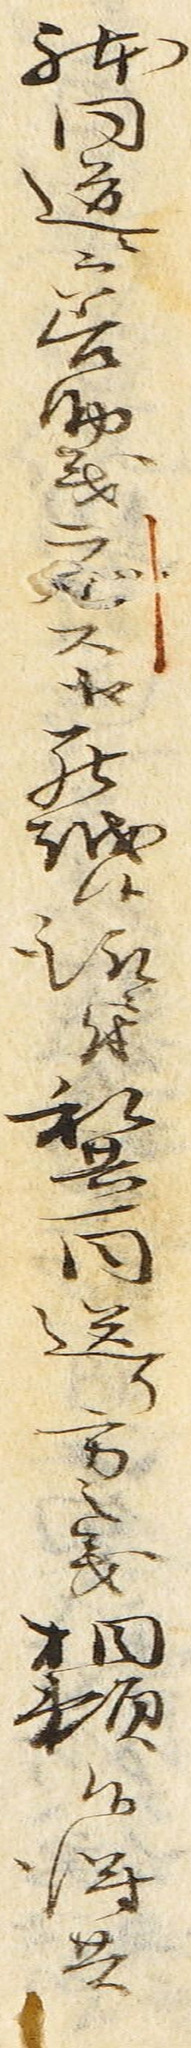躰同道に而善助義ラボス江罷越候趣に付私共一同見送り方之義相頼候得共
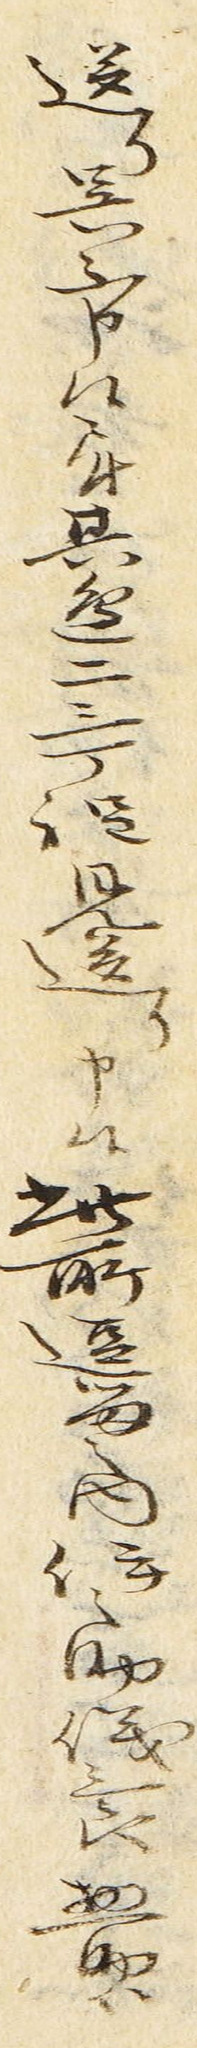送り呉不申候に付其辺二三丁程見送り申候此所漂流之内伊之助儀三郎惣助は
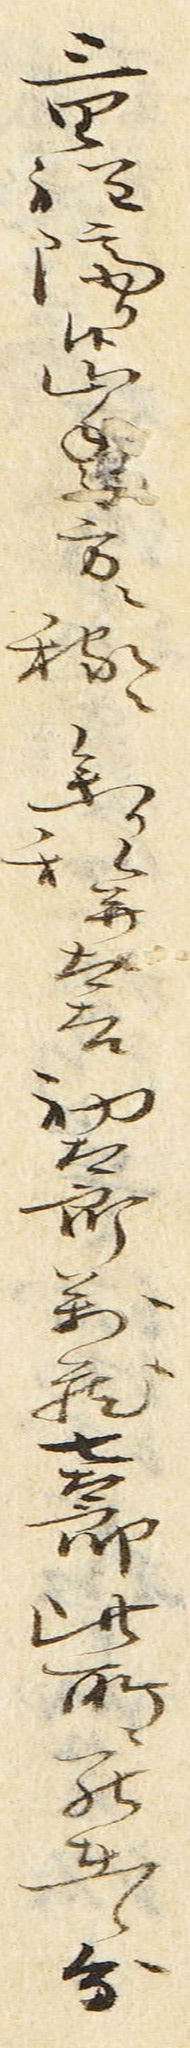三里程隔り候山手？方に稼に参り私並太吉初太郎藤蔵七太郎此所に罷在候分
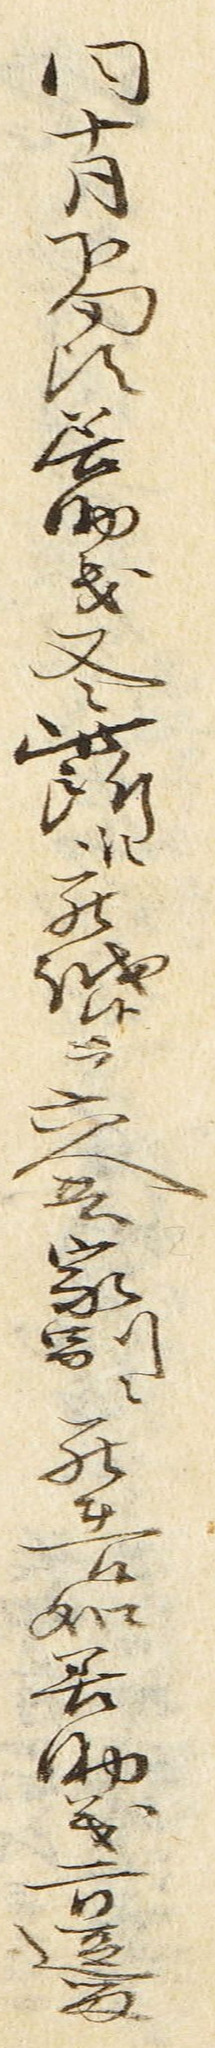同十月下旬頃善助義又又此所江罷越候に而六人共家別罷在候処善助義二日逗留
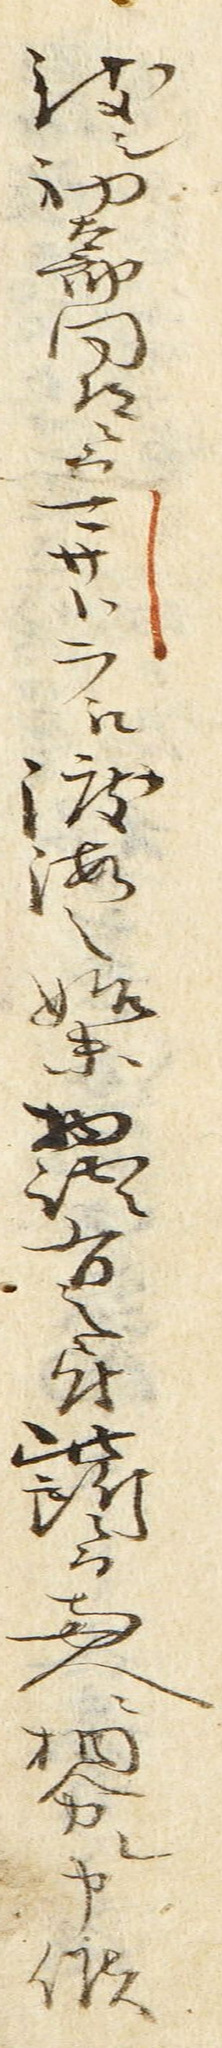致し初太郎同道に而マサトラ江渡海之始末物證有之に付此所に而両人に相分れ申候

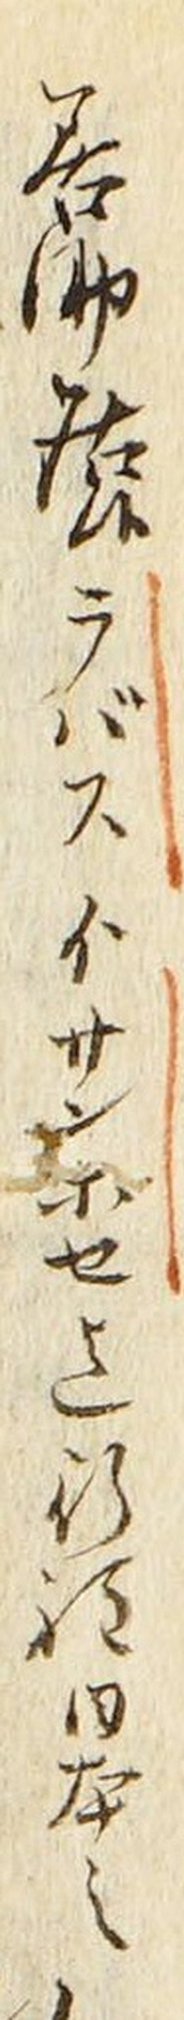二行文善助居候ラバスゟサンㇹセ迠行程日本之
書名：長崎漂流記
